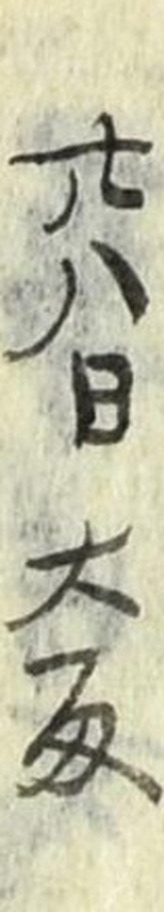廿八日大雨
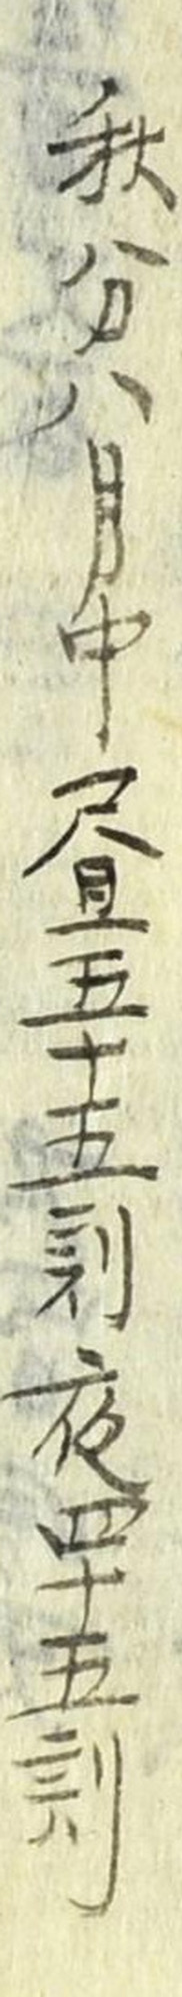秋分八月中昼五十五刻夜四十五刻
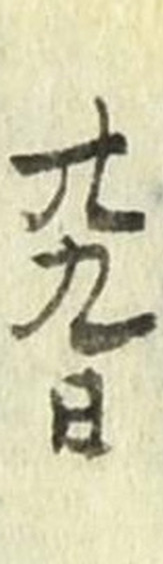廿九日

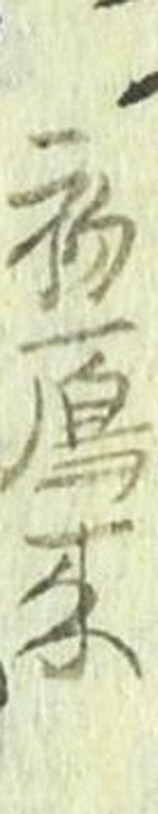初雁来
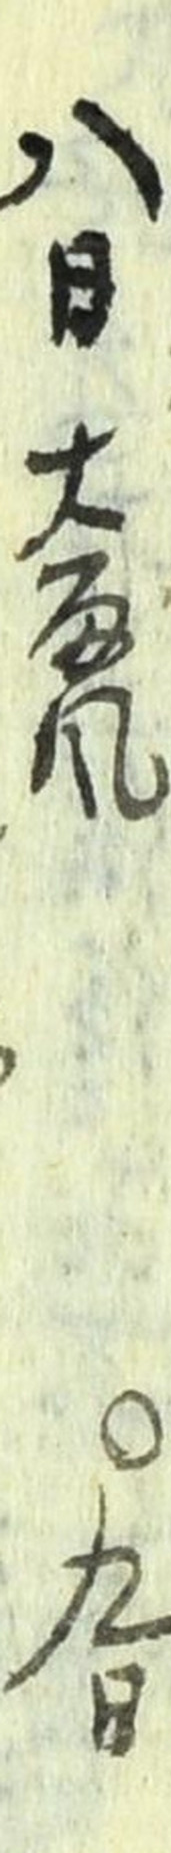八日大雨風○九日
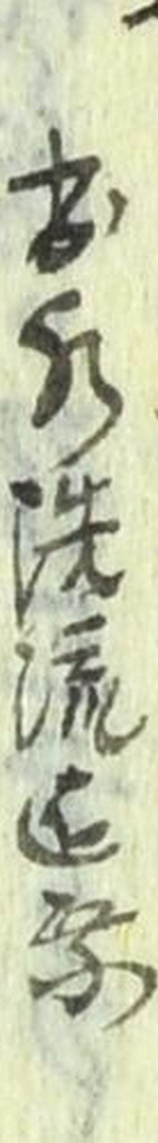出水洗流迄乗
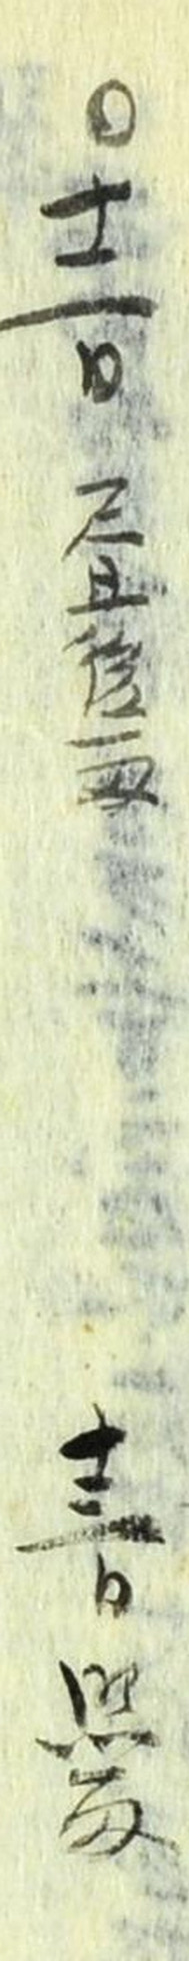○十二日昼後雨十三日照雨
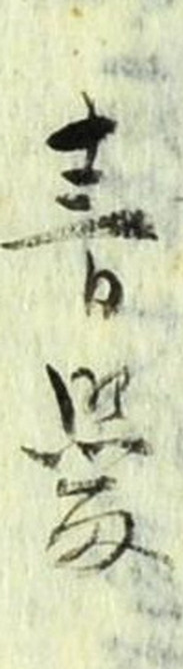十四日照雨
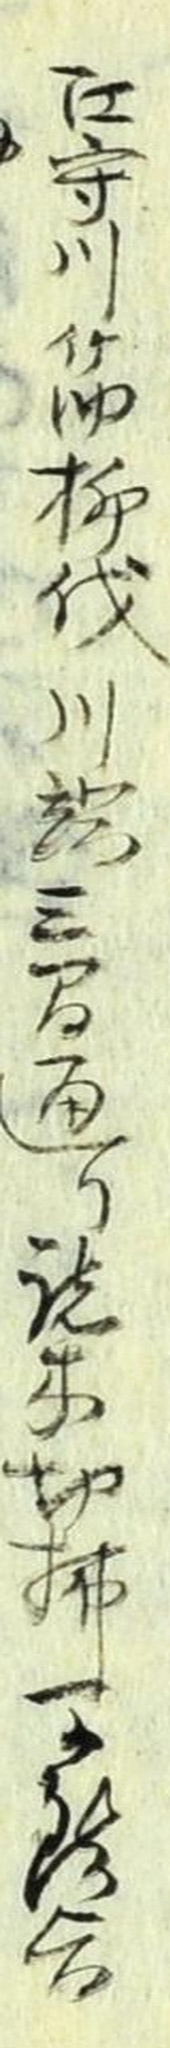江守川筋柳伐川端三間通り諸木切払可致旨
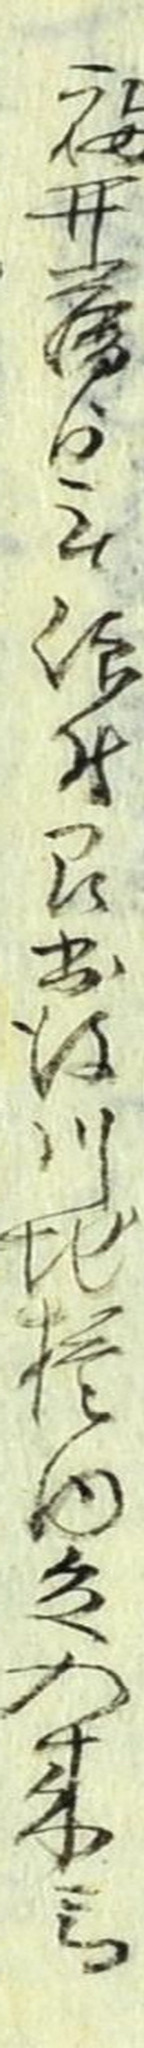福井藩ゟ被仰付即出役川地権内殿入来ニ而
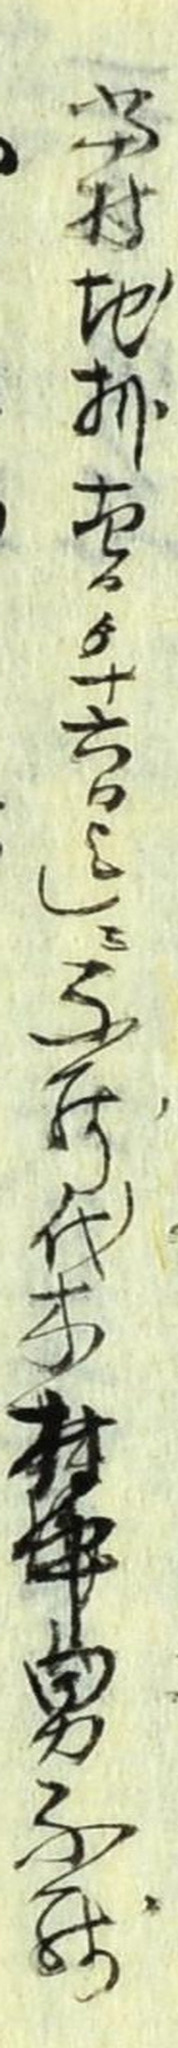当村地柳十四日ゟ十六日迄ニ不残伐木村中男不残
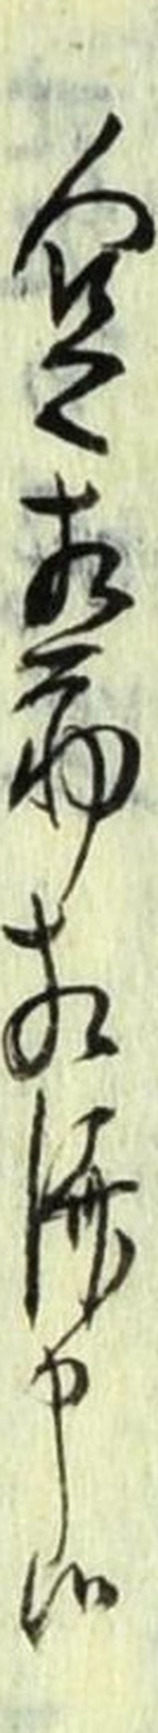人足相勤相済申候
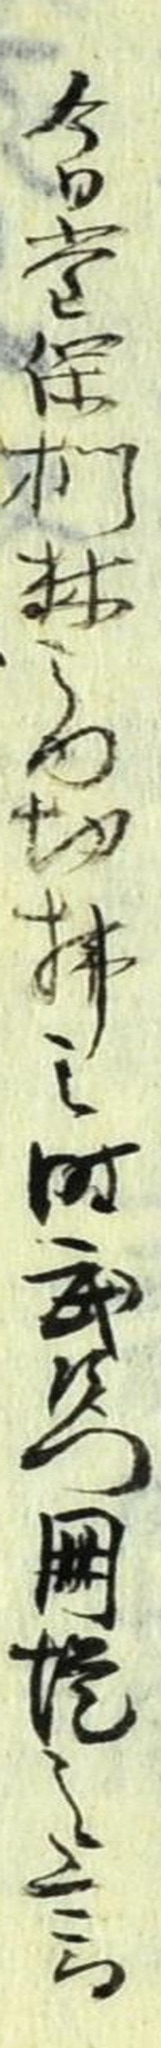今日堂保椚林之内切払之時武左衛門囲堤之上ニ而
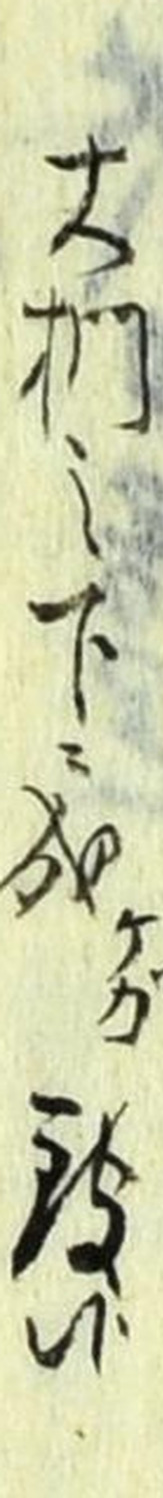大椚之下ニ成ケガ致候
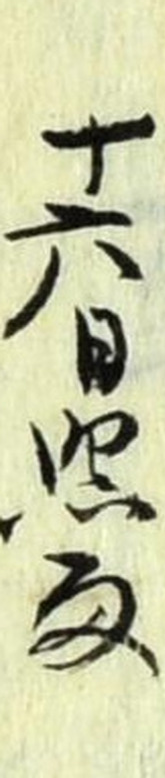十四日照雨
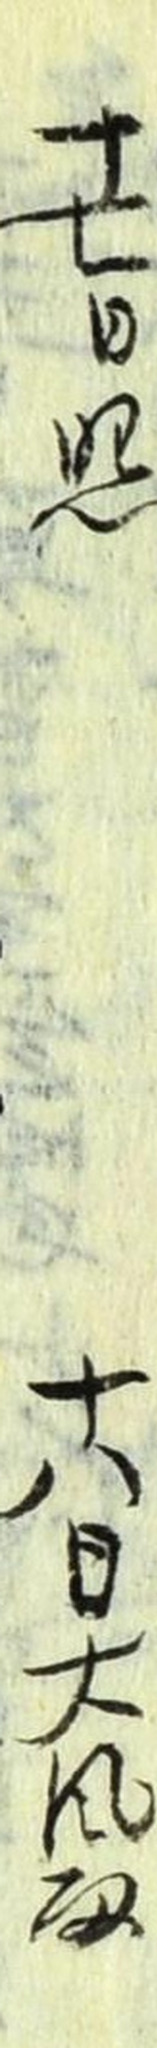十七日照十八日大風雨
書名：（日記）
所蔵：福井県文書館 Fukui Prefectural Archives
